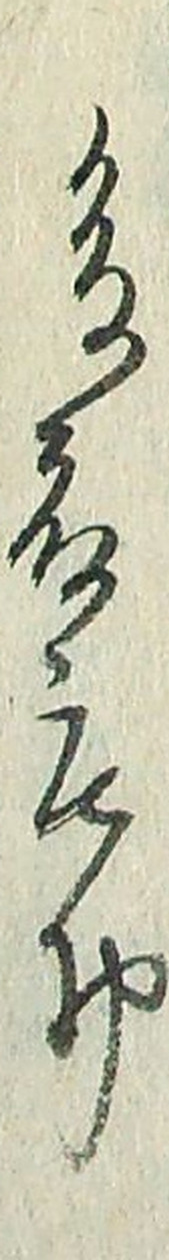後藤庄助

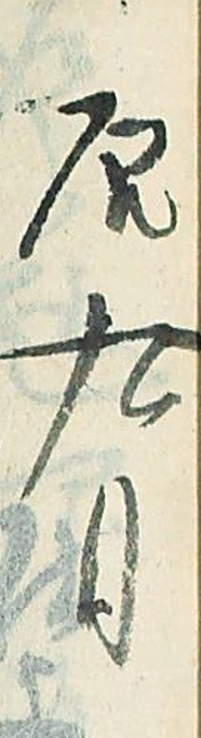辰九月
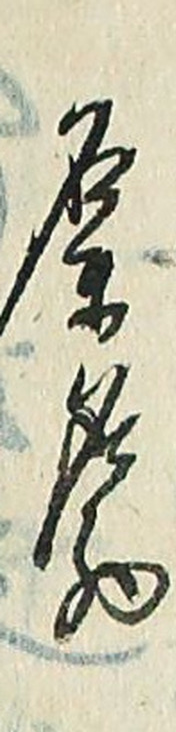名東名西
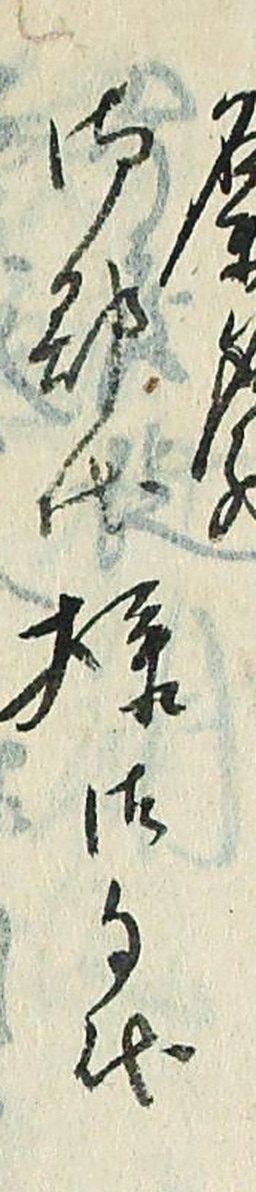御郡代様御手代
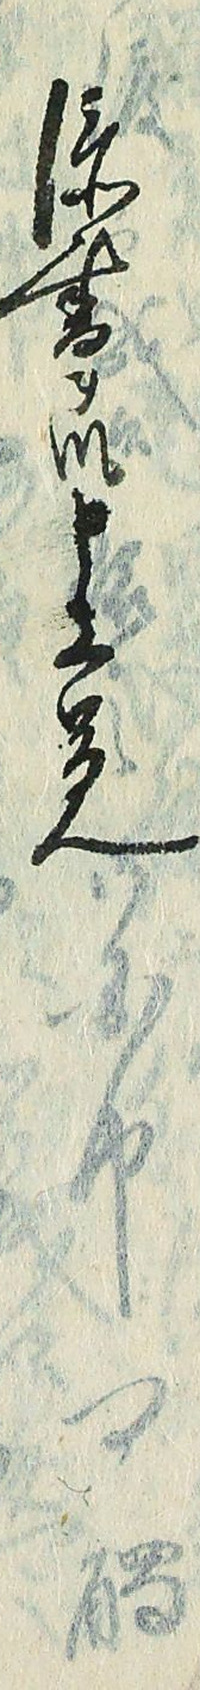添書を以申上覚
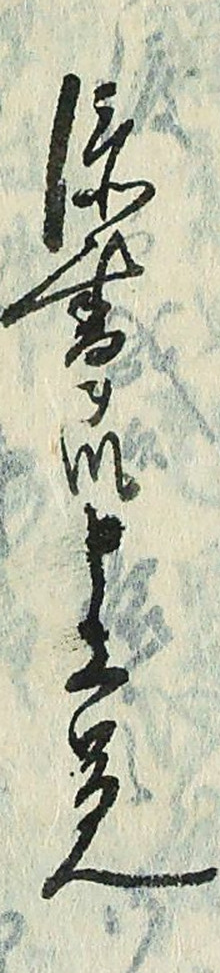添書を以申上覚
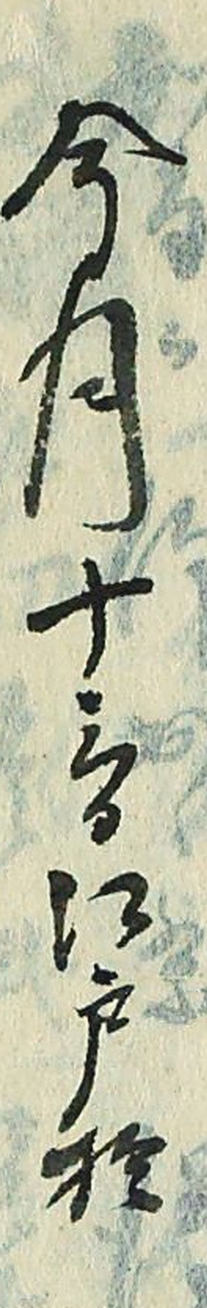今月十三日江戸於
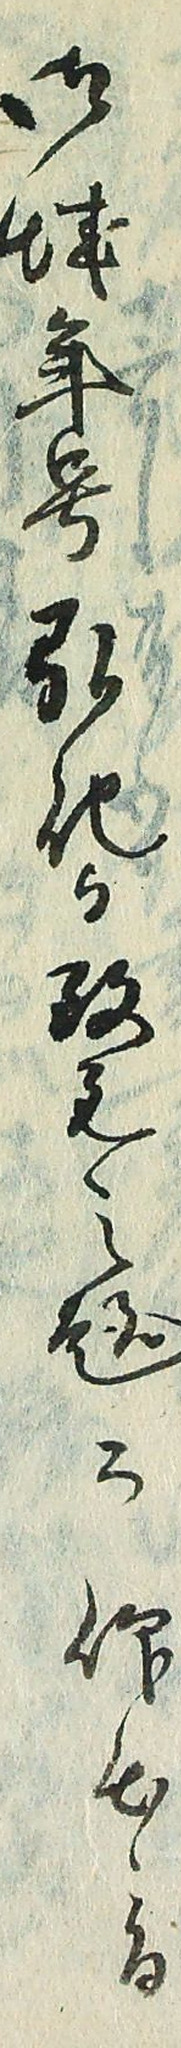御城年号弘化と改元之趣被仰出候旨
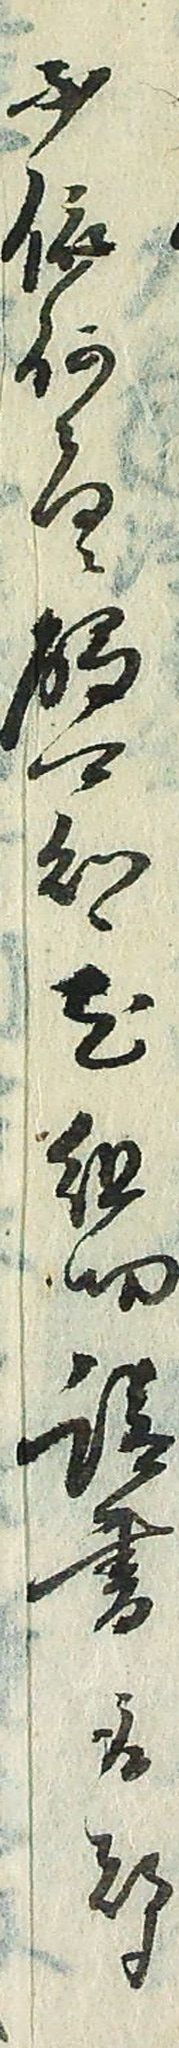不依何者に触可知候尤組切請書取都め
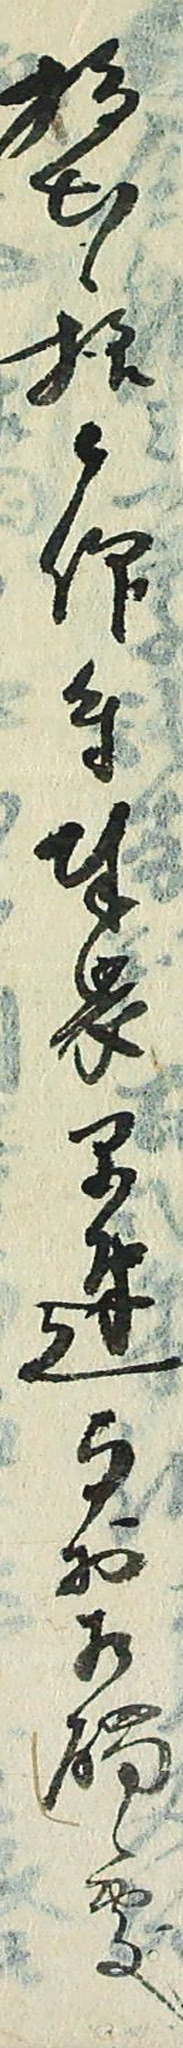指出候様被仰付奉畏早速与村相触候処
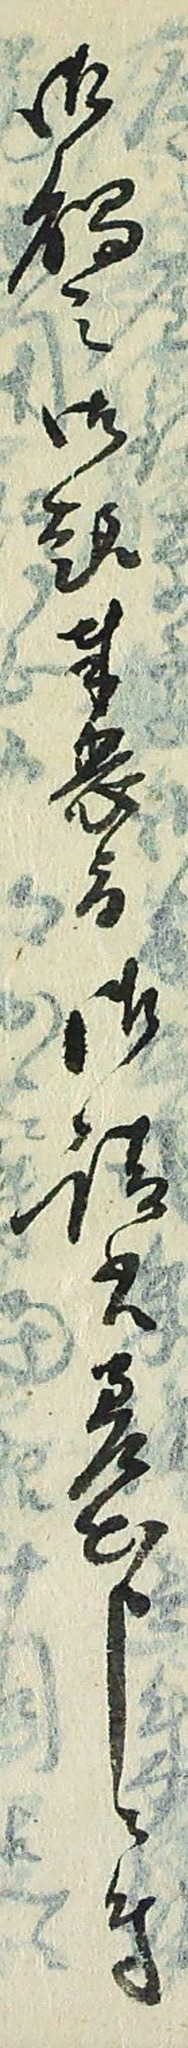御触の御趣奉畏旨御請書差出申に付
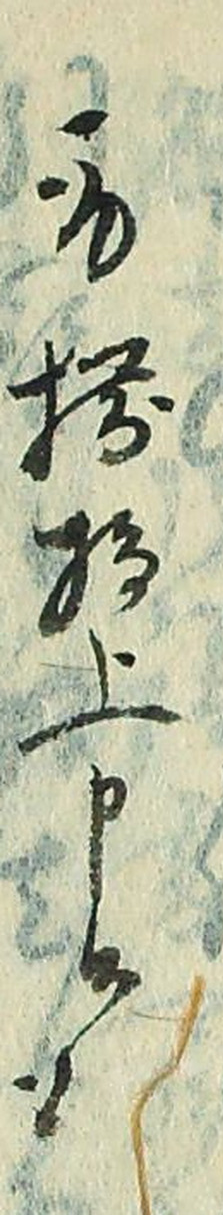取揃指上申候以上
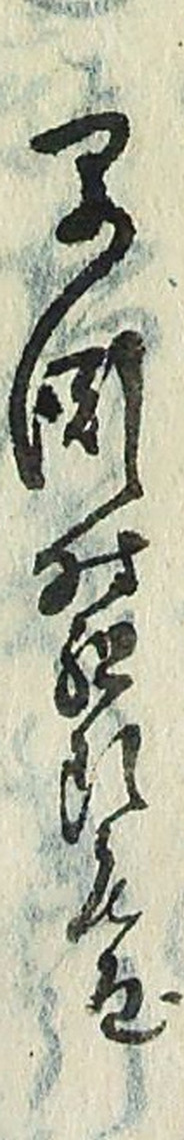早淵村組頭庄屋
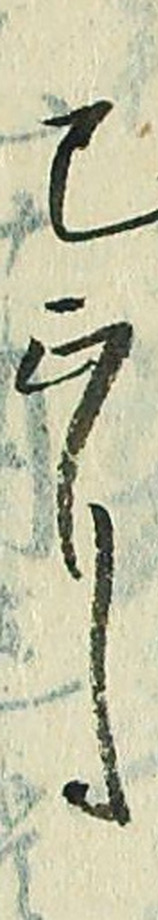巳正月
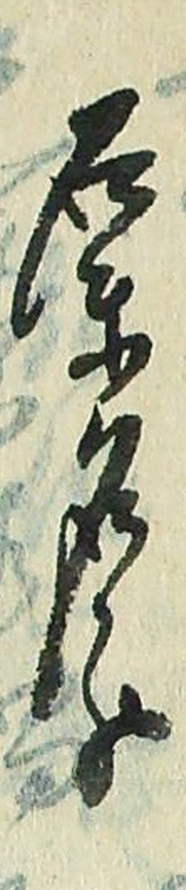名東名西
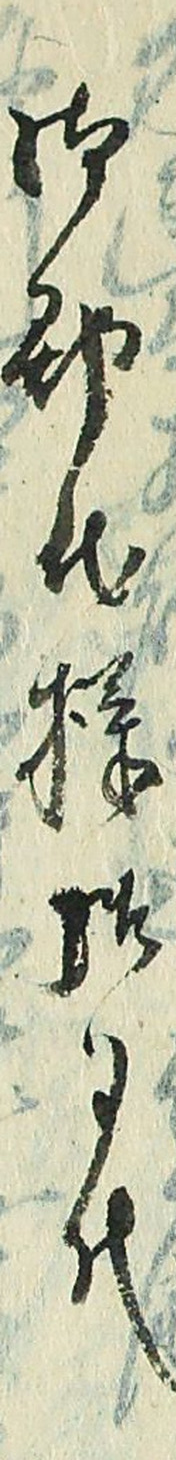御郡代様御手代
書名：諸御用御□受書控
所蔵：鳴門教育大学 Naruto University of Education
